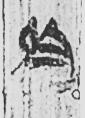於
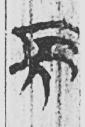長
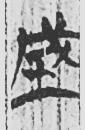城
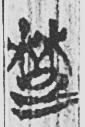楚
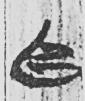𠂤
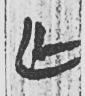亡
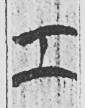工
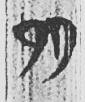多
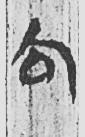{勹厶}
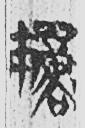{巾單口}
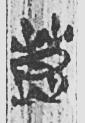莫
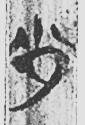肖
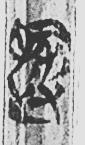{豚止又}
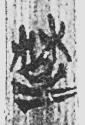楚
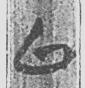㠯（以）
